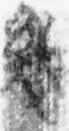幾
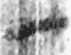一
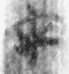才（在）
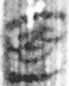{匚去}
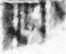{阝咸}
